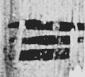三
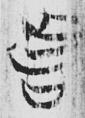善
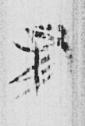○（盡）
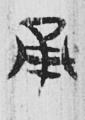甬（用）
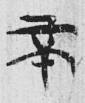不
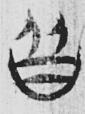皆（棄）
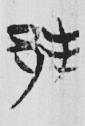邦
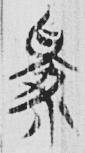{爪家}（家）
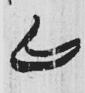㠯
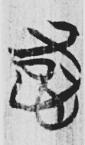{厷心}（雄）
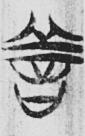善
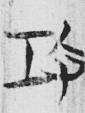攻
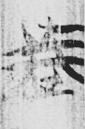者
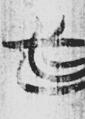必
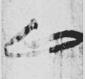㠯（以）
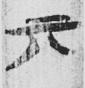亓
